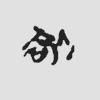咎
